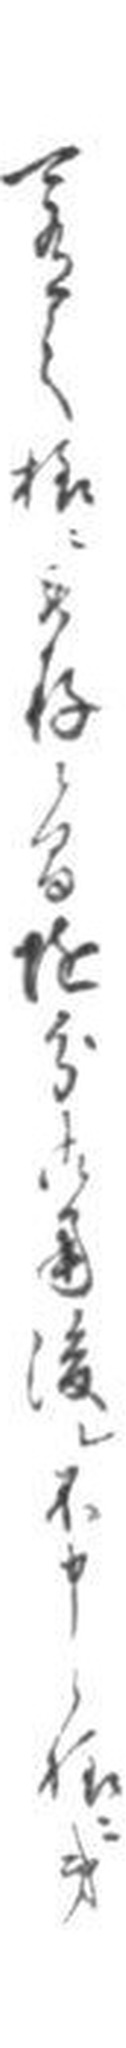可有之様ニ被存候間随分御用後レ不申候様ニ第
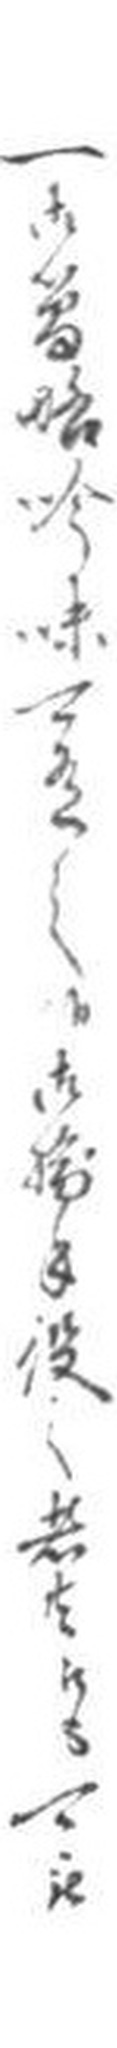一御簡略吟味可有之候御勝手役之者共江も可被
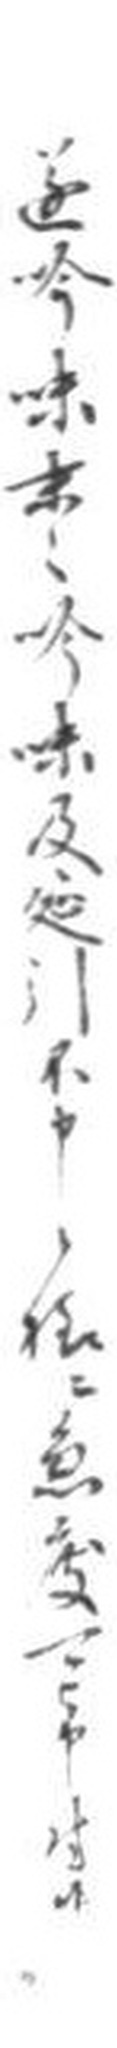遂吟味末々吟味及延引不申候様ニ急度可被申付候
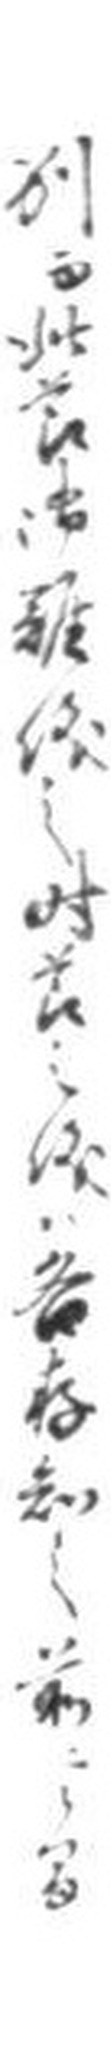別而此節御難儀之時節之儀ハ各存知之前ニ候間
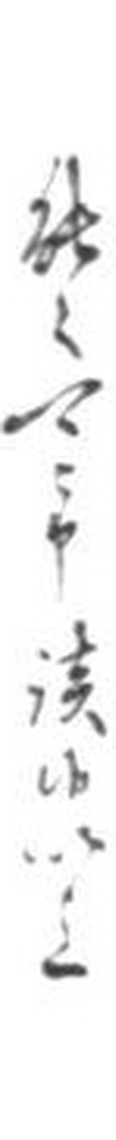能々可被申談候以上
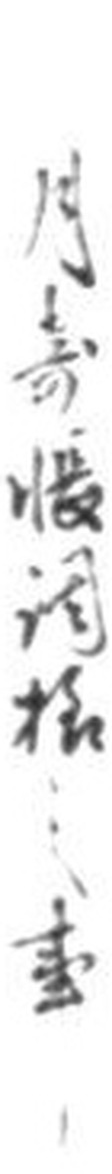月寄帳調様之事
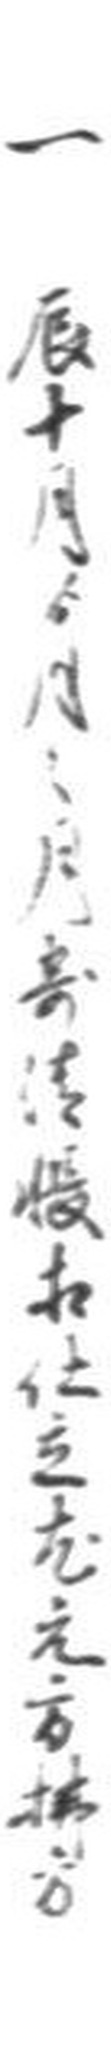一辰十月ゟ月々月寄請帳相仕立尤元方払方
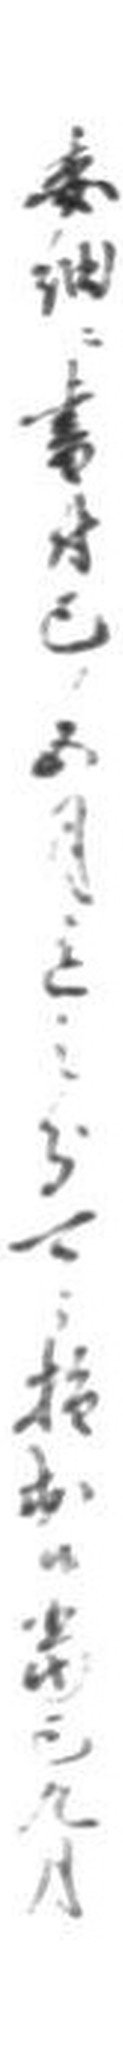委細ニ書付巳ノ五月迄之分可被指出候当巳九月
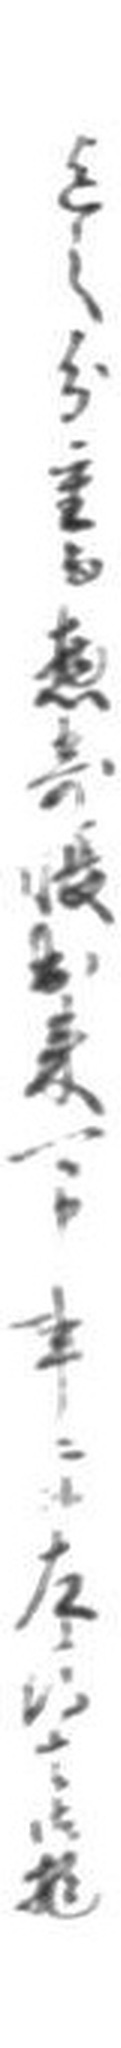迄之分重而惣寄帳出来可申事ニ候左候得者御物
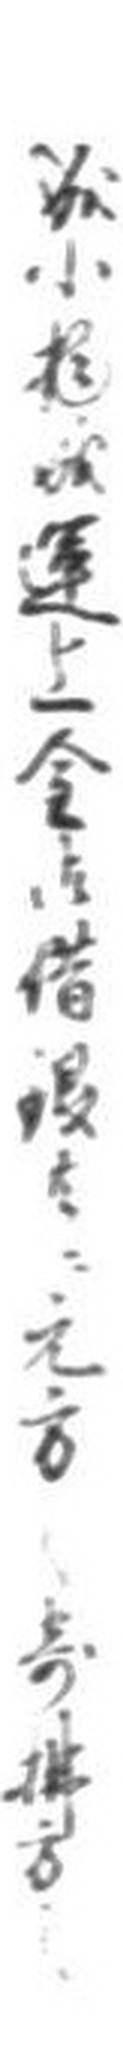成小物成運上金御借銀共ニ元方之寄払方之
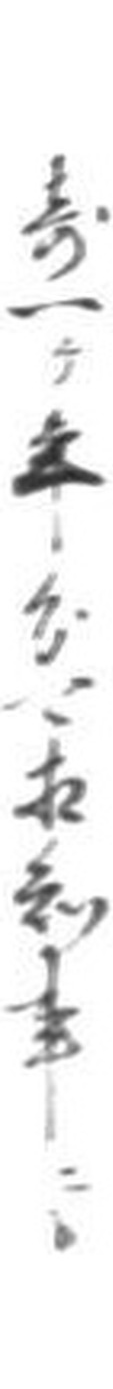寄一ケ年分可相知事ニ候
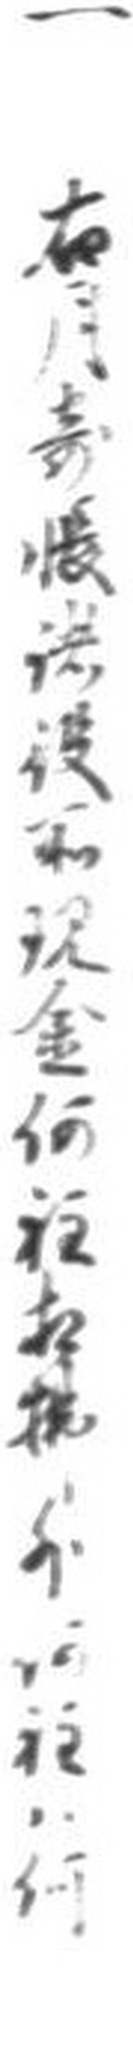一右月寄帳諸役所現金何程相払外何程ハ何
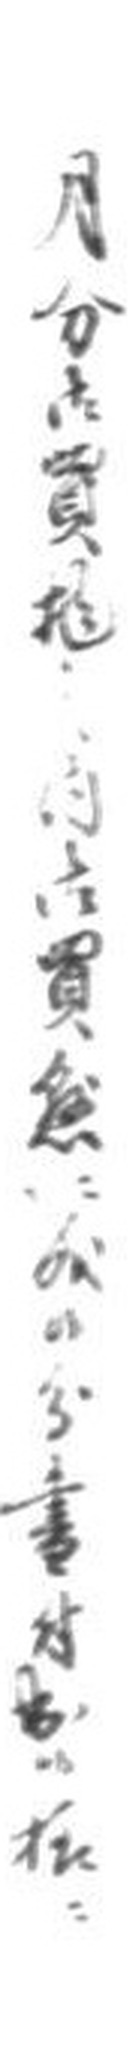月分御買物之内御買懸ニ成候分書付出候様ニ
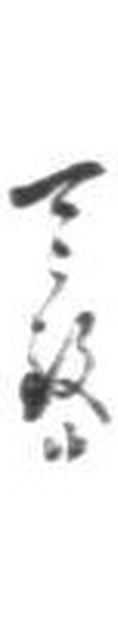可被致候
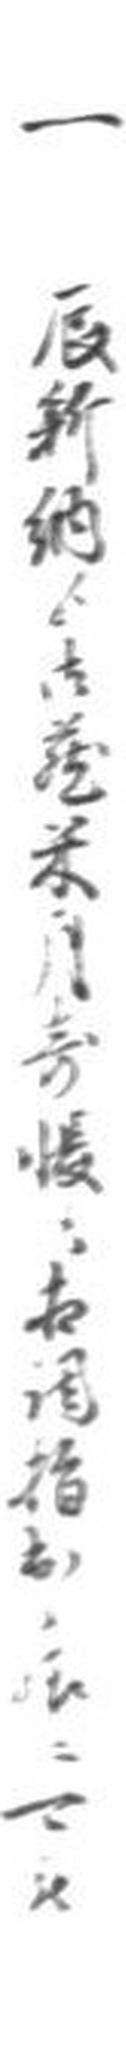一辰新納ゟ御蔵米月寄帳も相調指出候様ニ可被

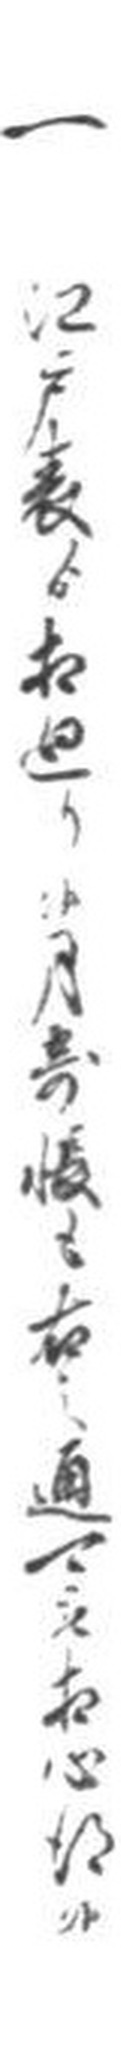一江戸表ゟ相廻り候月寄帳も右之通可被相心得候
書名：家譜 三十九 宗矩公 享保十年
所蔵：福井県文書館 Fukui Prefectural Archives
